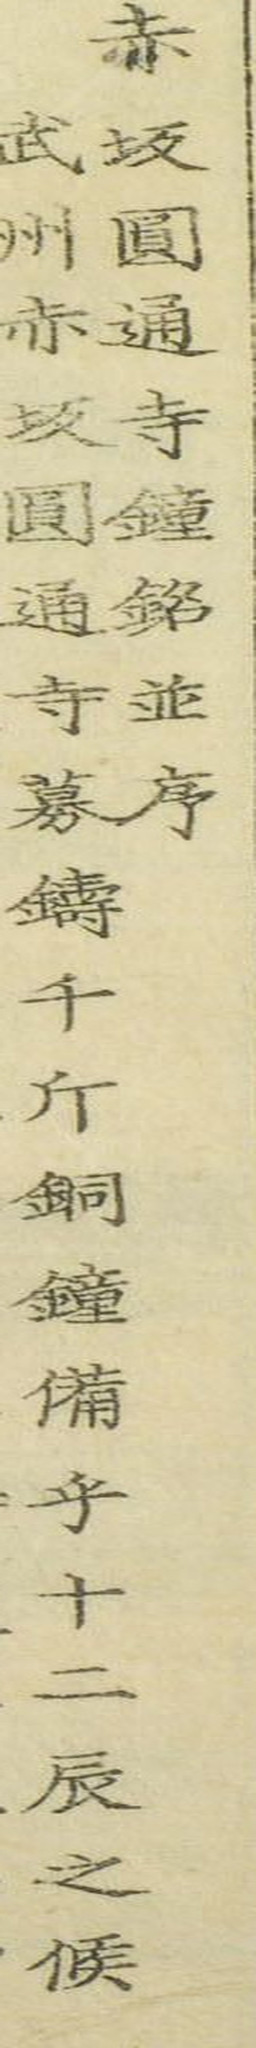武州赤坂圓通寺募鑄千斤銅鐘備乎十二辰之候
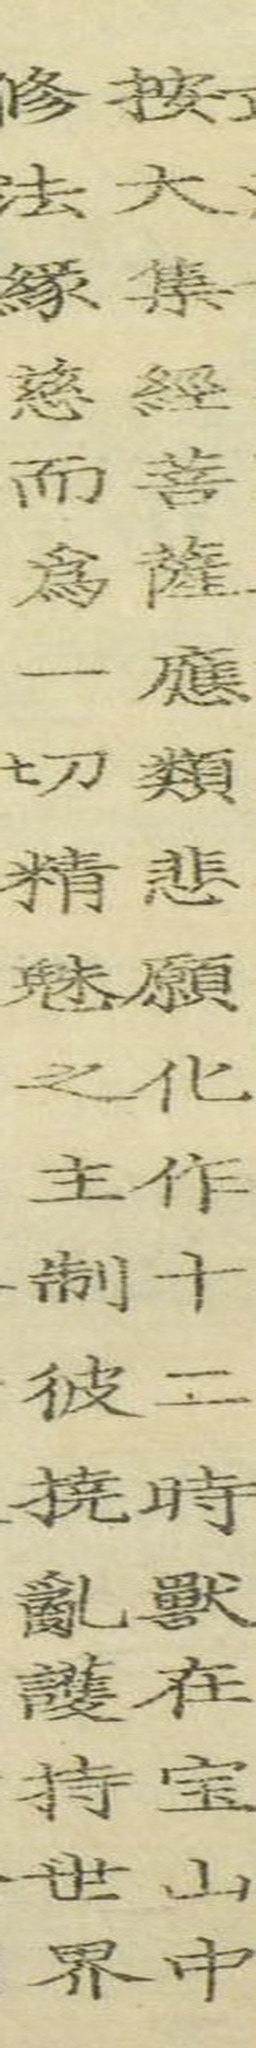修法縁慈而爲一切精魅之主制彼撓亂護持世界
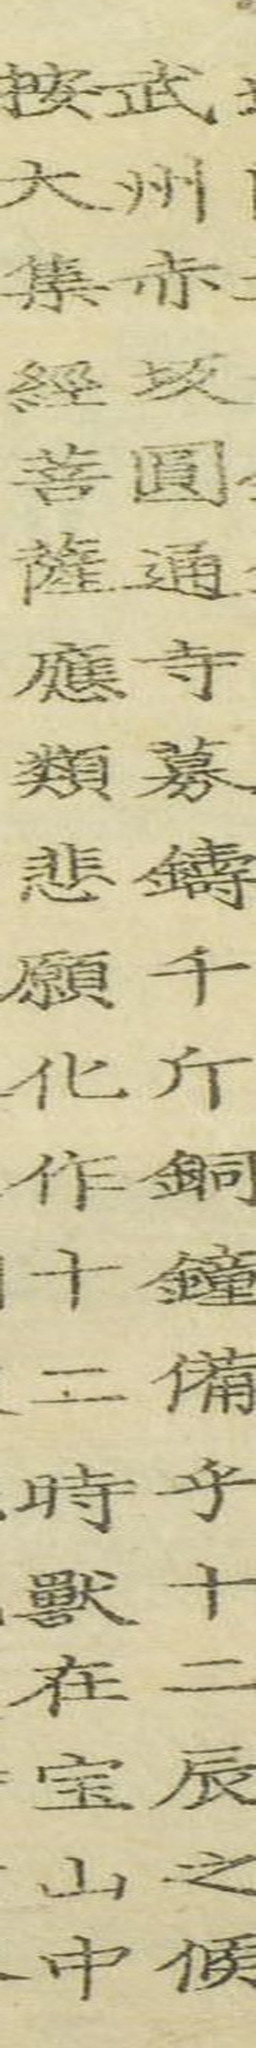按大集經菩薩應類悲願化作十二時獸在宝山中
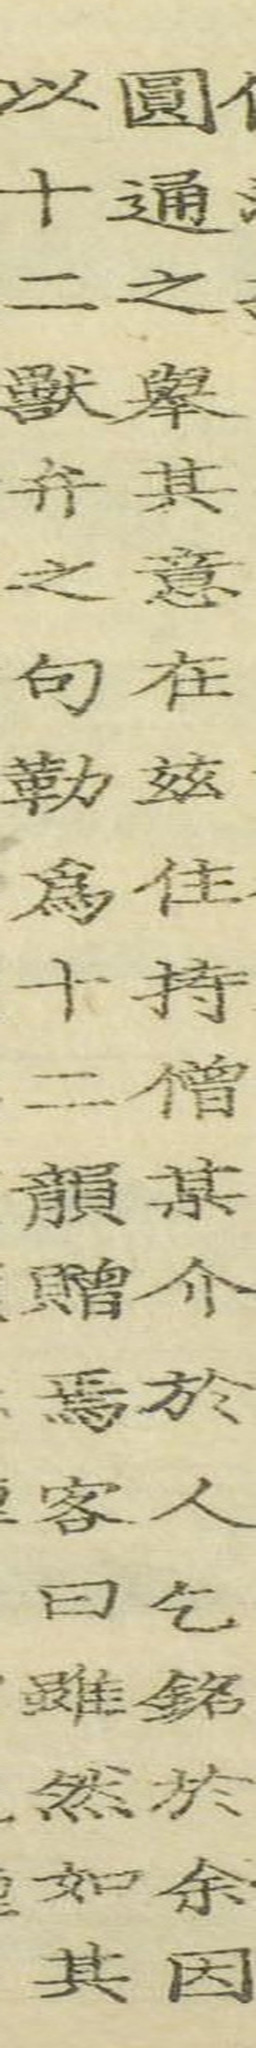以十二獸弁之句勒爲十二韻贈焉客曰雖然如其
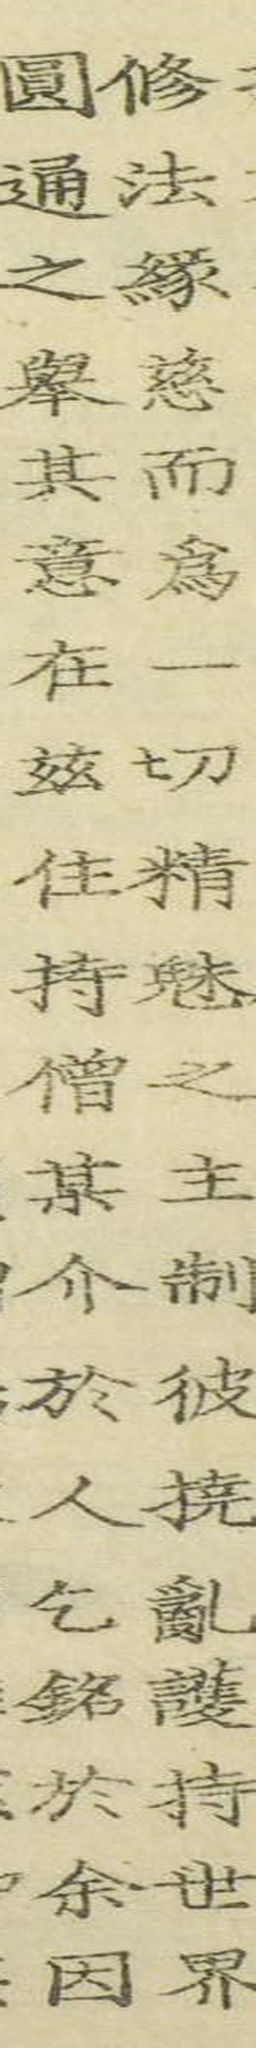圓通之舉其意在茲住持僧某介於人乞銘於余因
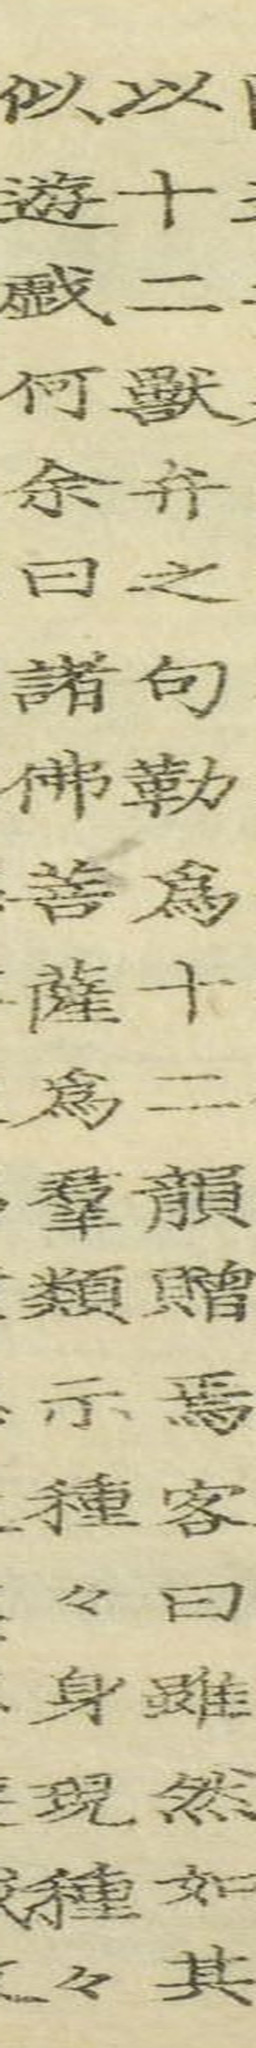似遊戯何余曰諸佛菩薩爲羣類示種々身現種々
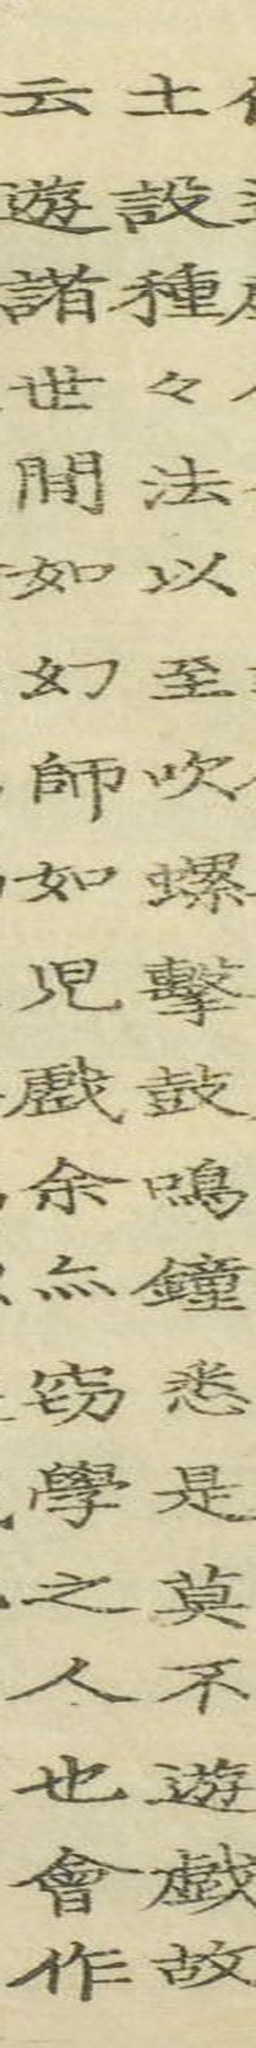云遊諸世閒如幻師如児戯余亦窃學之人也會作
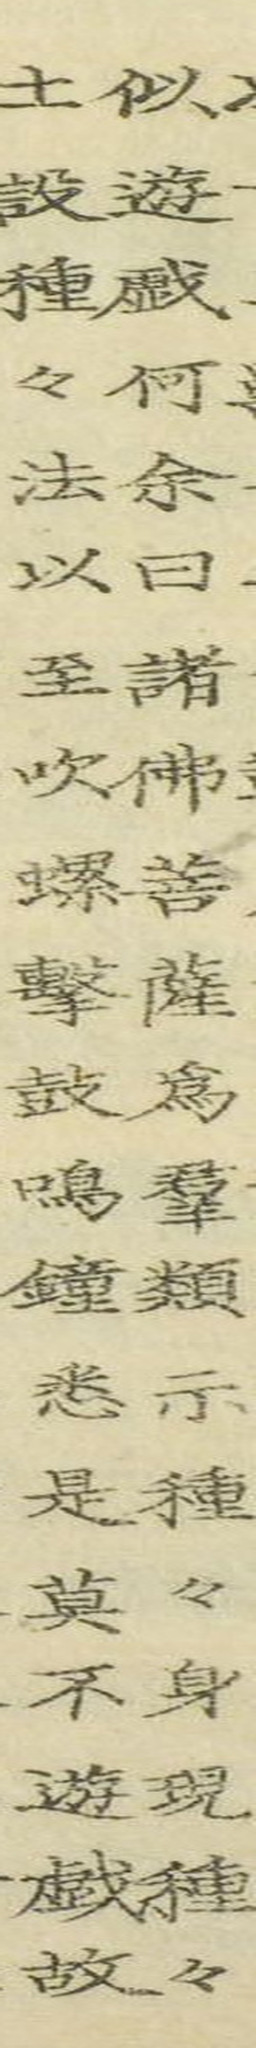土設種々法以至吹螺擊鼔鳴鐘悉是莫不遊戯故
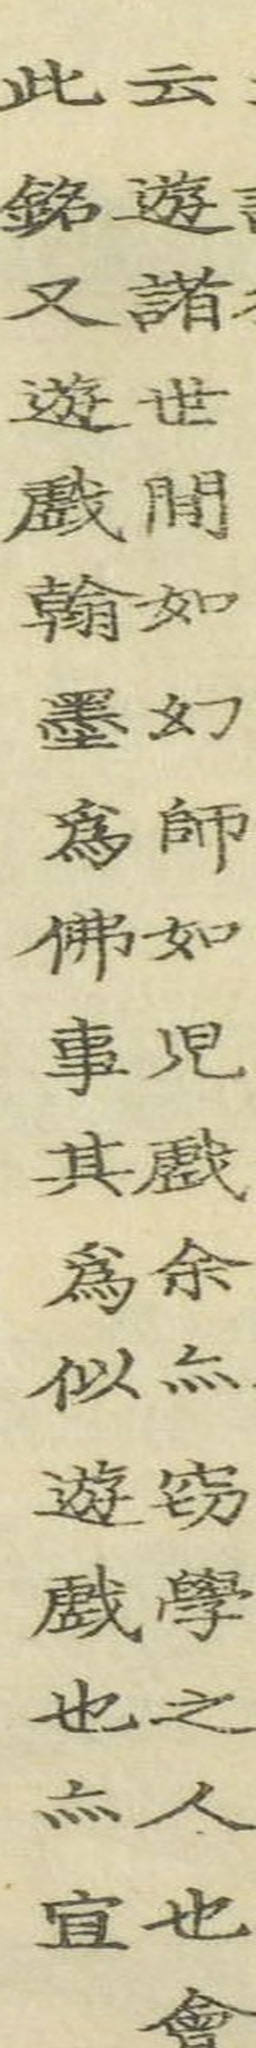此銘又遊戯翰墨爲佛事其爲以遊戯也亦宜
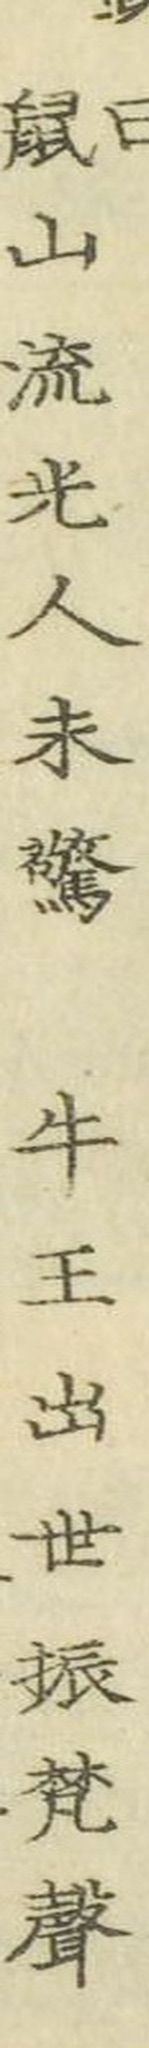鼠山流光人未驚牛王出世振梵聲
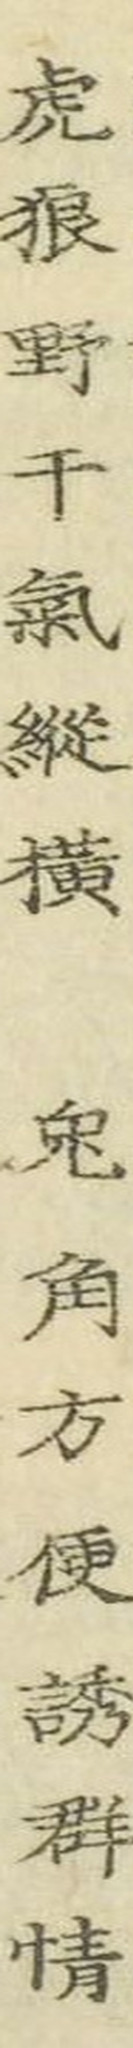虎狼野千氣縱横兎角方便誘群情
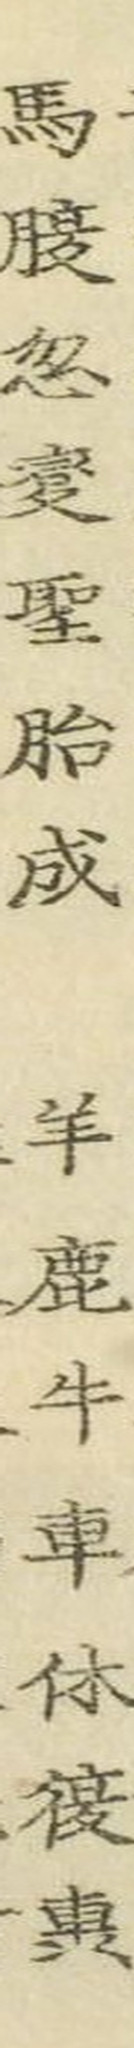馬腹忽變聖胎成羊鹿牛車休復軣
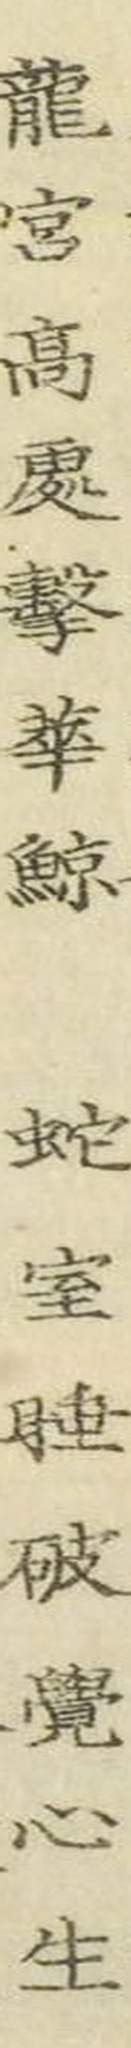龍宮髙處擊蕐鯨蛇室睡破覺心生
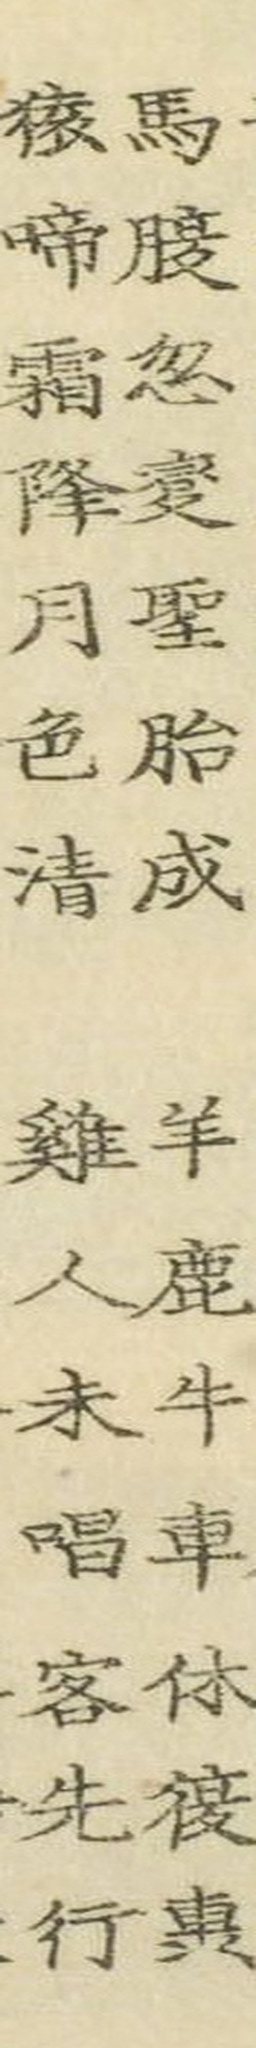猿啼霜䧏月色清雞人未唱客先行
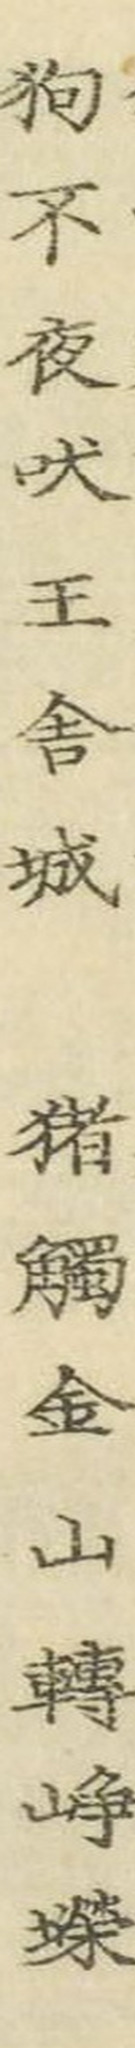狗不夜吠王舎城猪觸金山轉崢𫮴
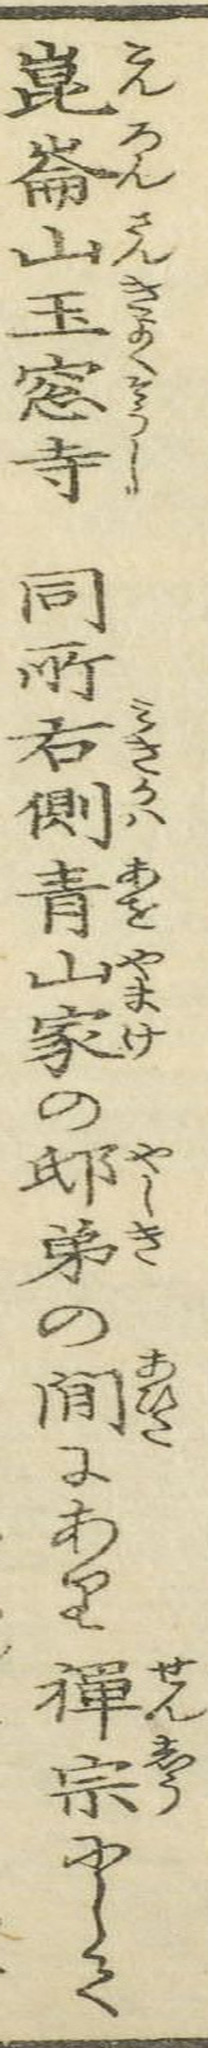崑崙山玉窓寺同所右側青山家の邸弟の間にあり禪宗にして
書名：江戸名所図会 20巻 巻之8
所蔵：東京学芸大学教育コンテンツアーカイブ
